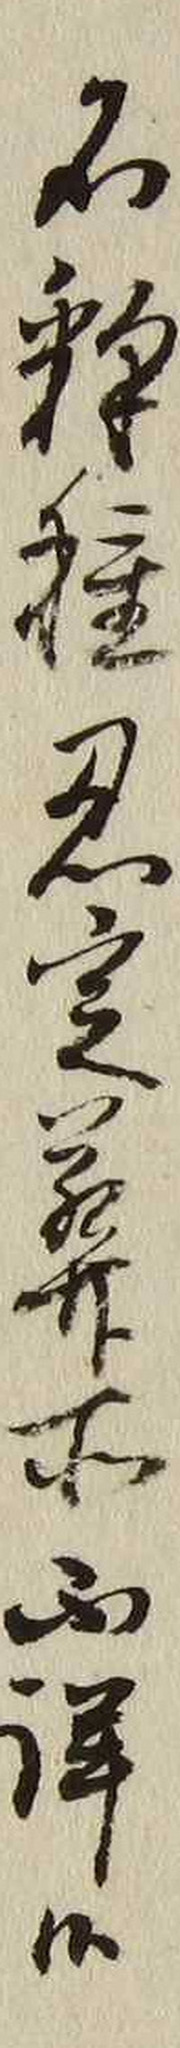名釈種忍定葬所不詳候
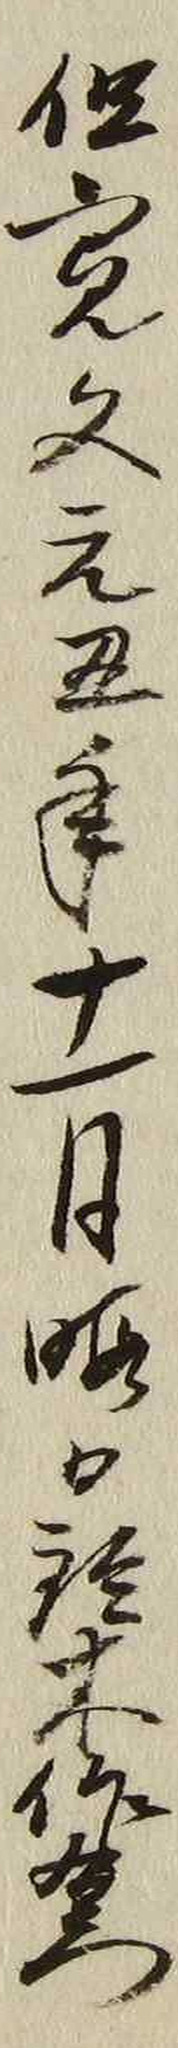但寛文元丑年十一月晦日鈴木作右衛門
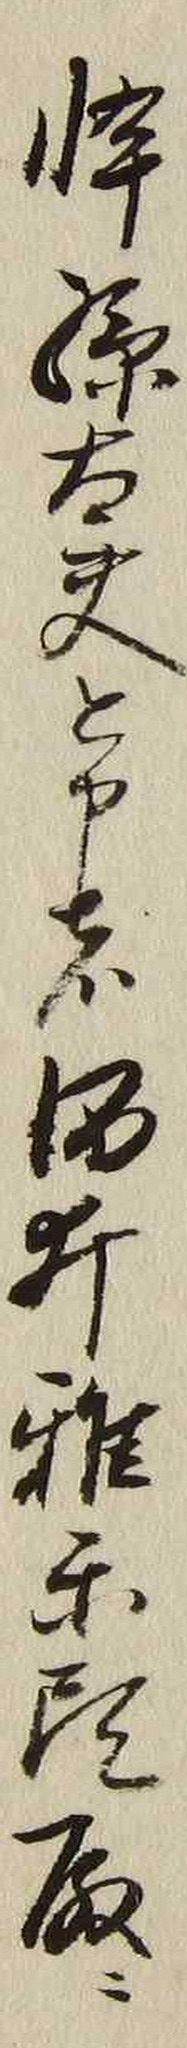忰孫太夫と申者酒井雅楽頭殿ニ
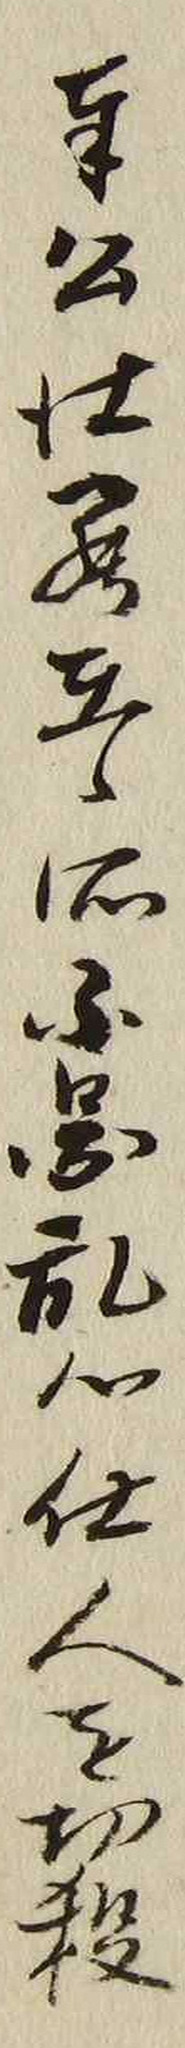奉公仕罷在候所不図乱心仕人を切殺
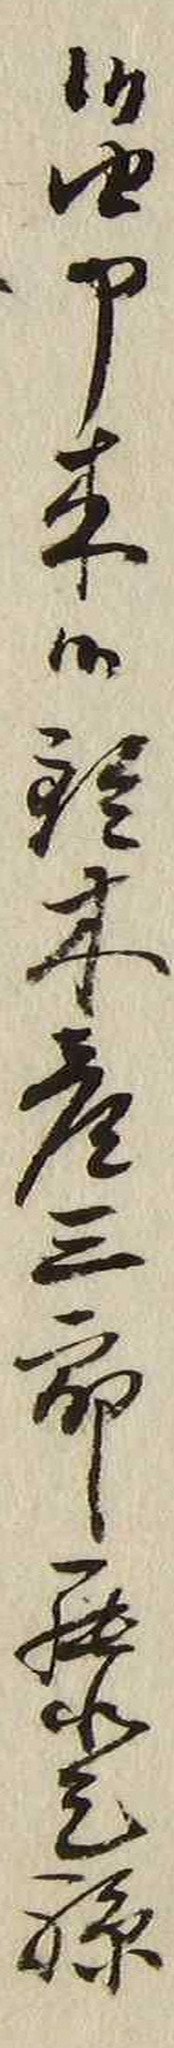候由申来候鈴木彦三郎罷登孫
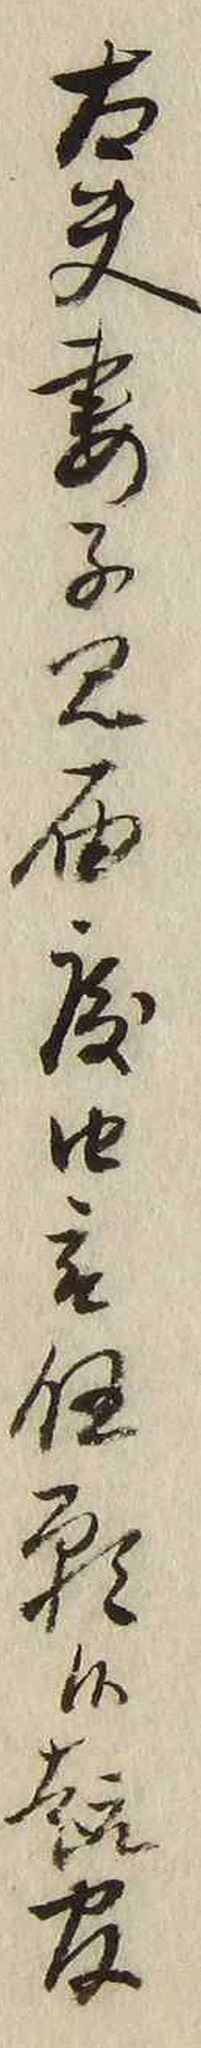太夫妻子見届度由被任願候趣官

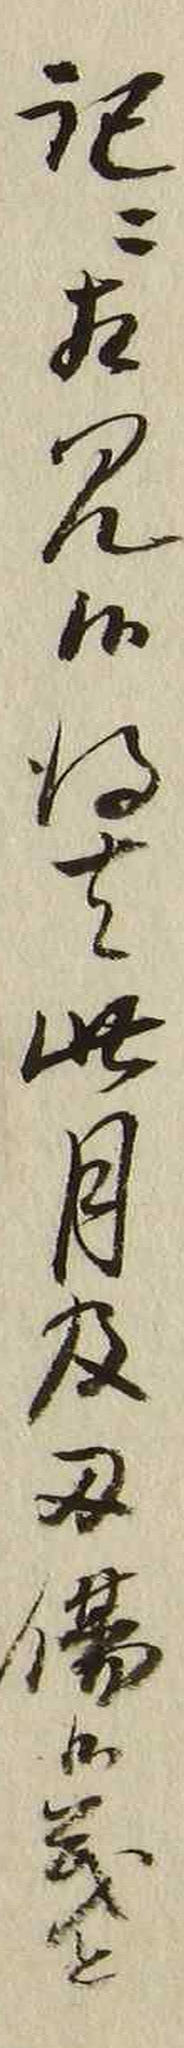記ニ相見候得者此月及刃傷候義と
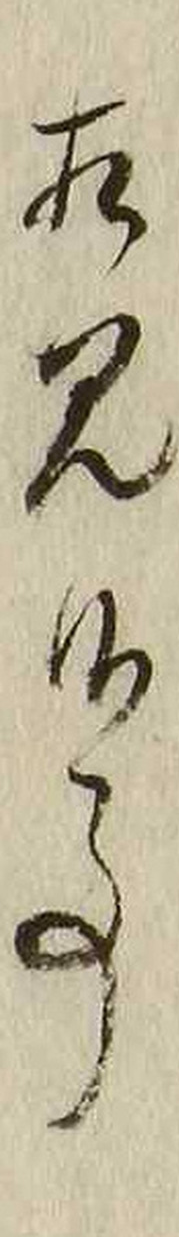相見候事
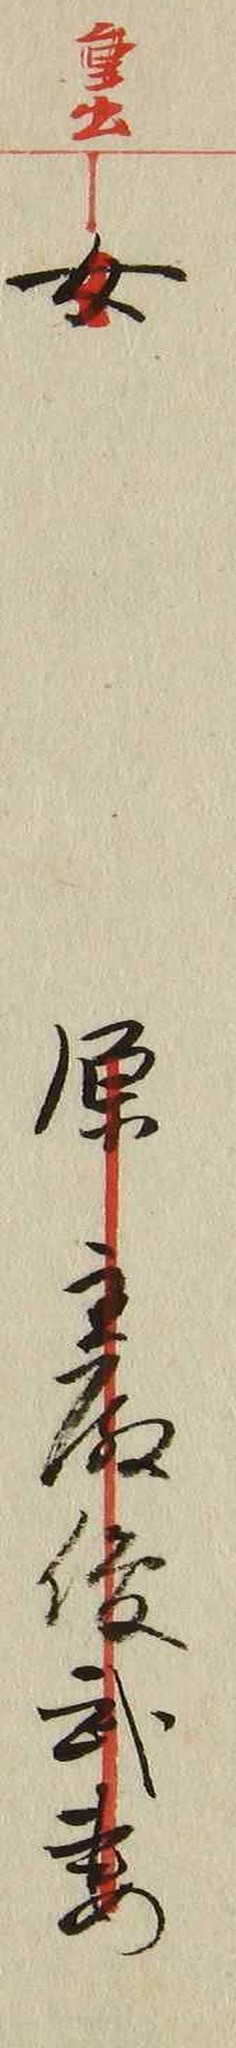女原主殿俊武妻
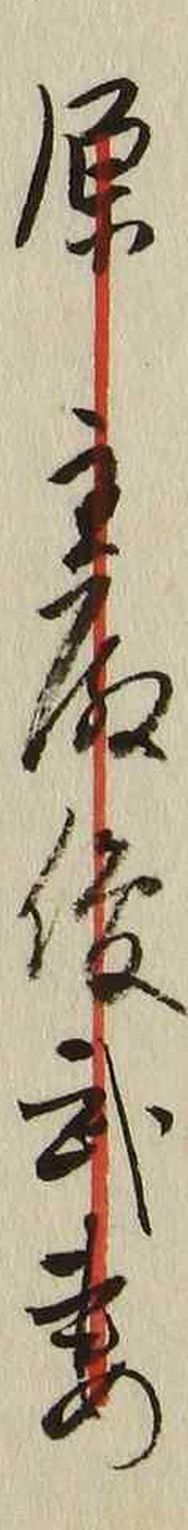女原主殿俊武妻
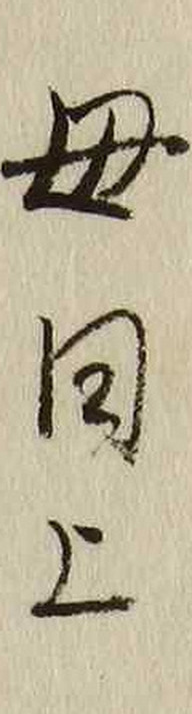母同上
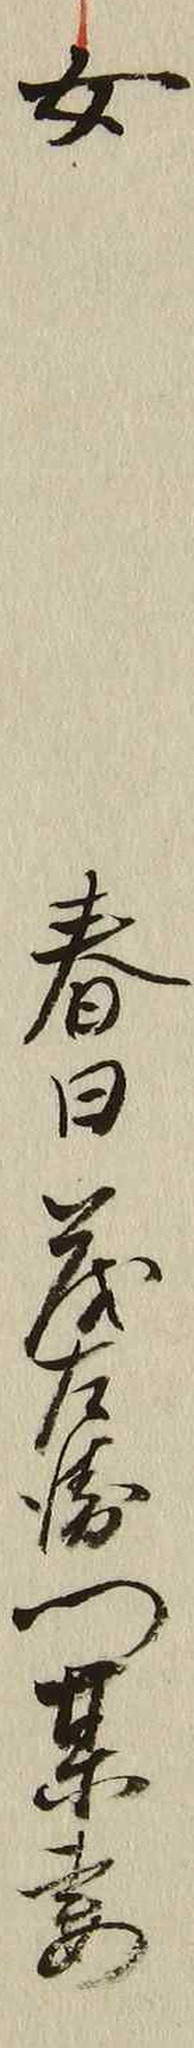女春日茂左衛門某妻
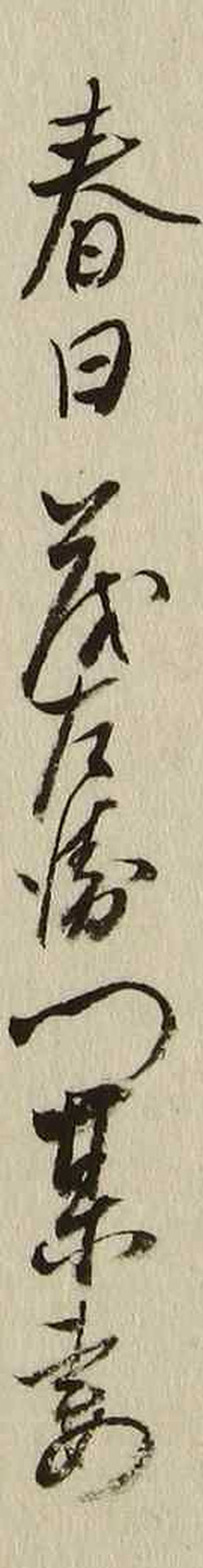女春日茂左衛門某妻
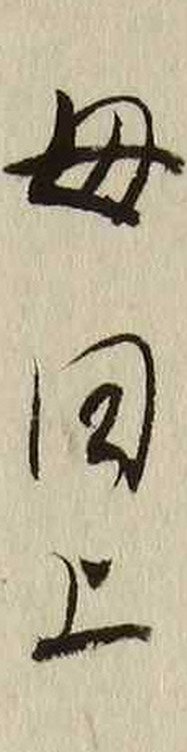母同上
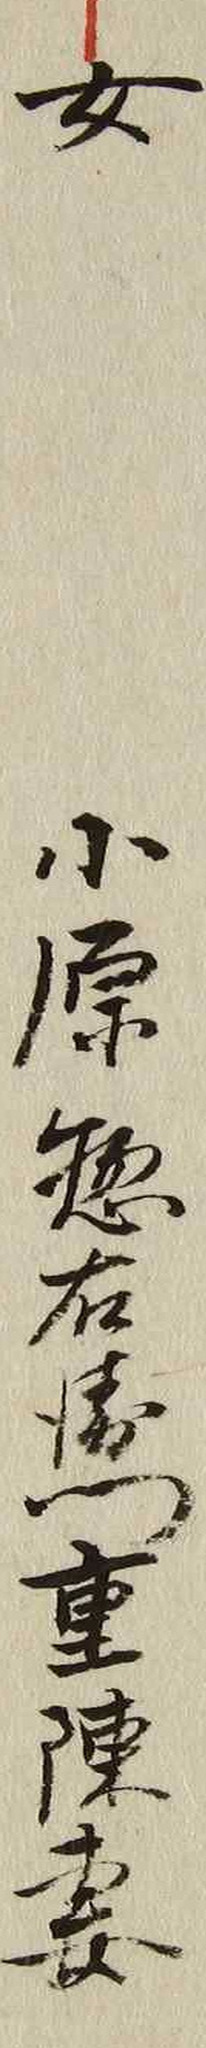女小原惣右衛門重陳妻
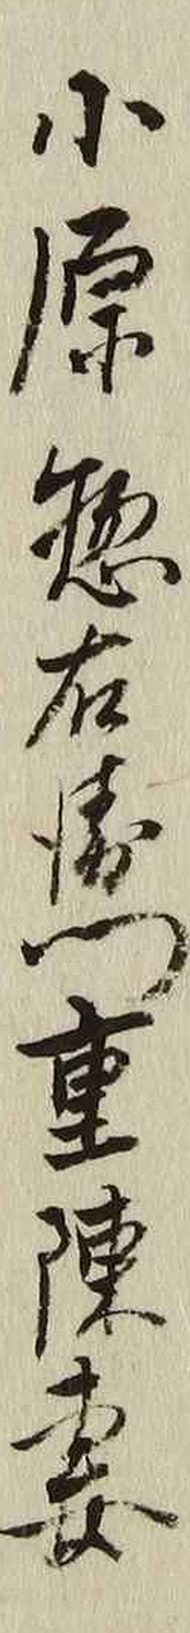女小原惣右衛門重陳妻
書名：諸士系譜　巻之356　す之部6
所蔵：会津若松市立会津図書館
